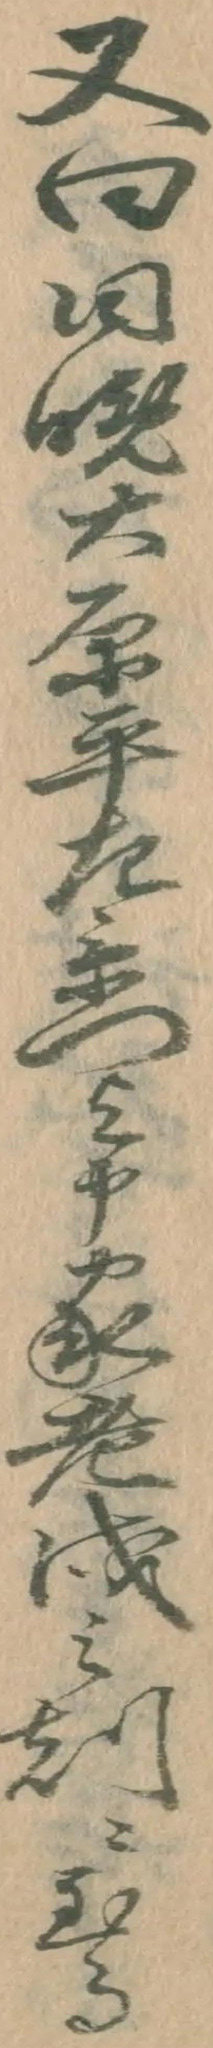又曰同晩大原平左衛門与申家老戌之刻に至る

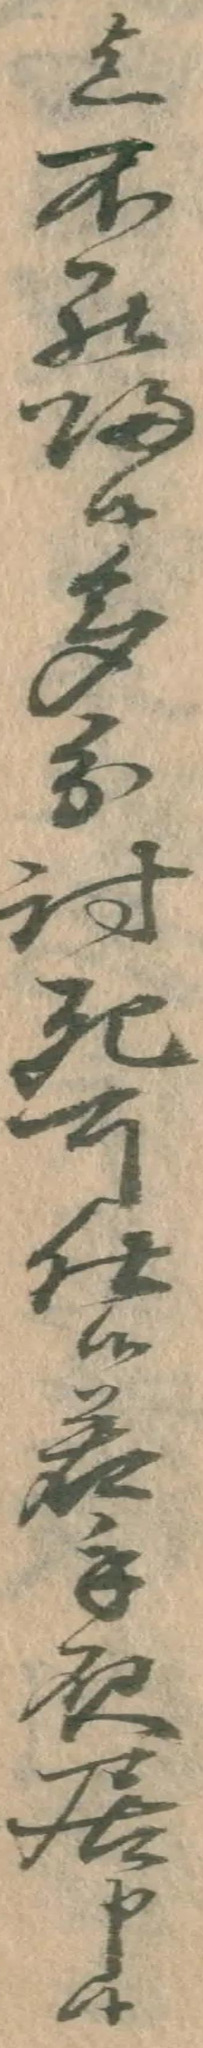迄不罷帰候多分討死可仕候若手負居申候
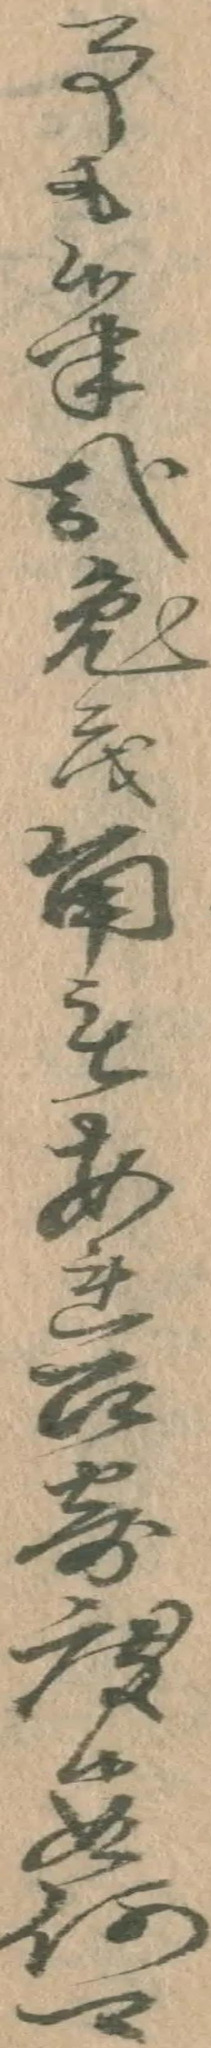事も候半哉兎茂角もあ連召寄度候如何可
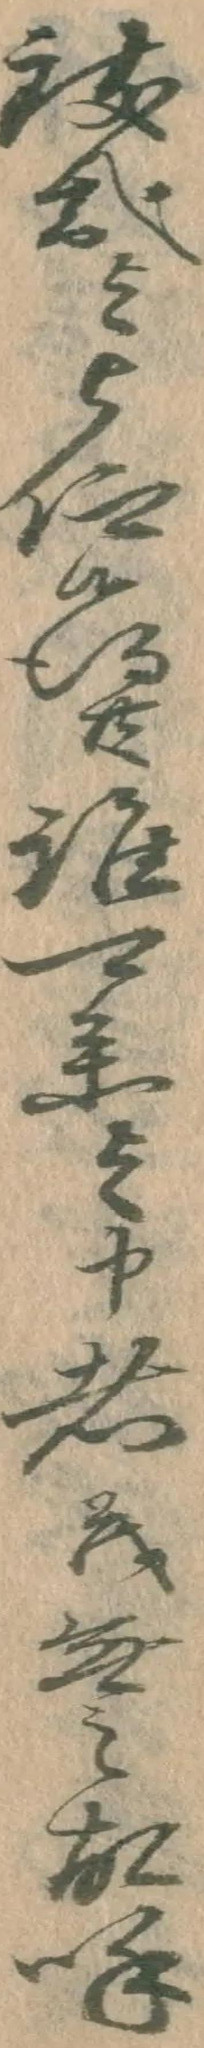致哉与被仰候得共誰可参与申者茂無之故呼
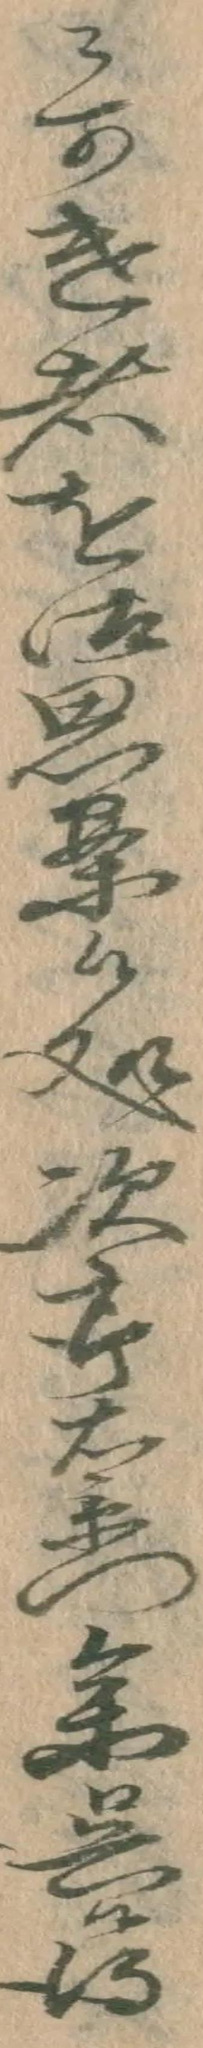に可遣者を御思案候処次郎右衛門参呉候得
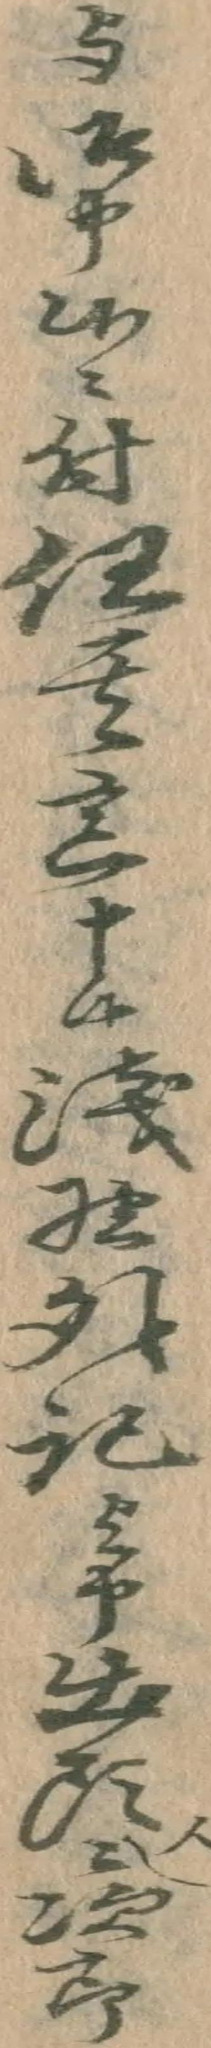与御申候に付任其意申候浅野外記与申出頭人に次郎
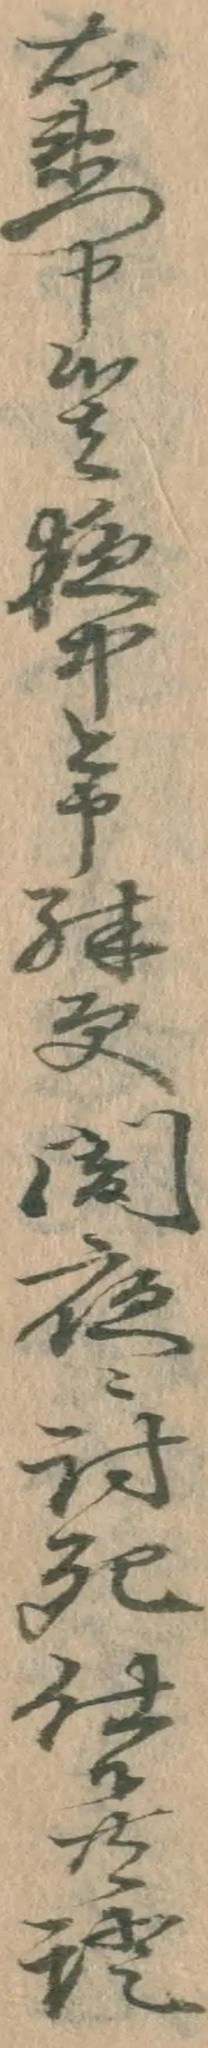右衛門申候者夜中と申殊更闇夜に討死仕候共證
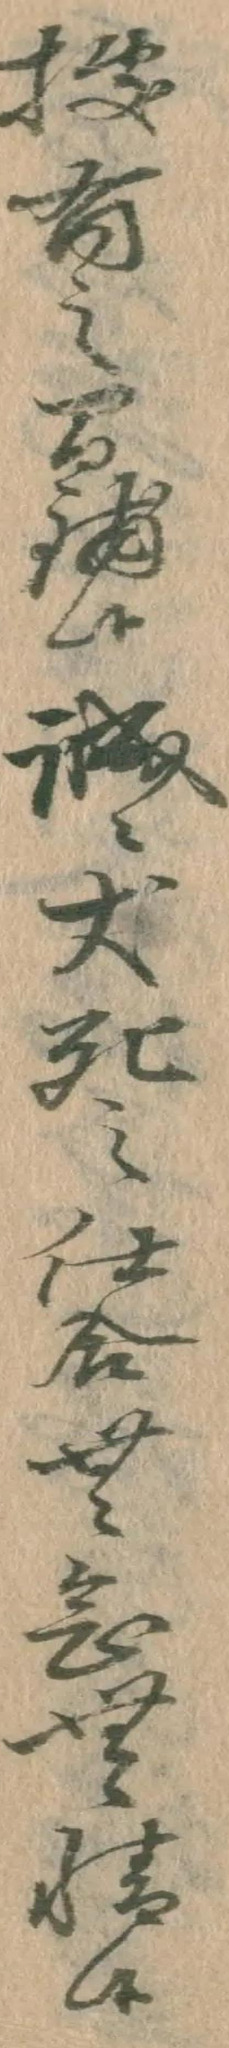拠有之間鋪候誠に犬死之仕合無念無情候
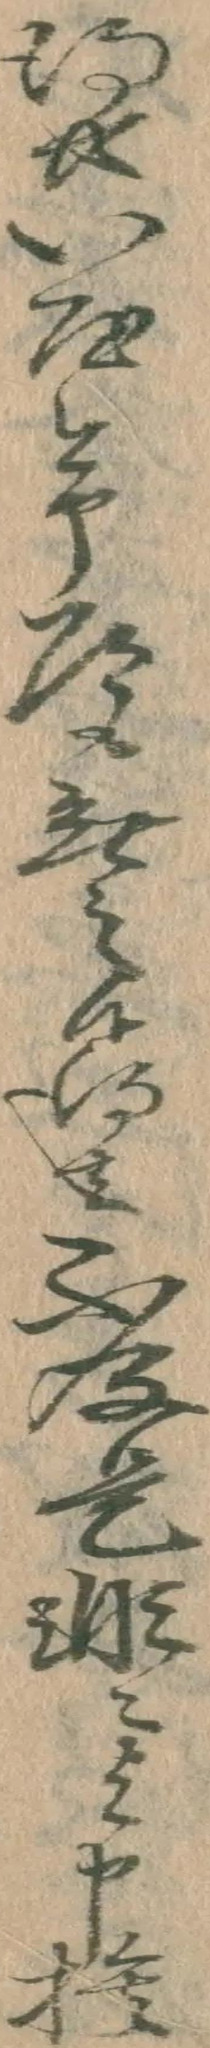得共い屋と申道も無之候得者ふ及是非に与申捨
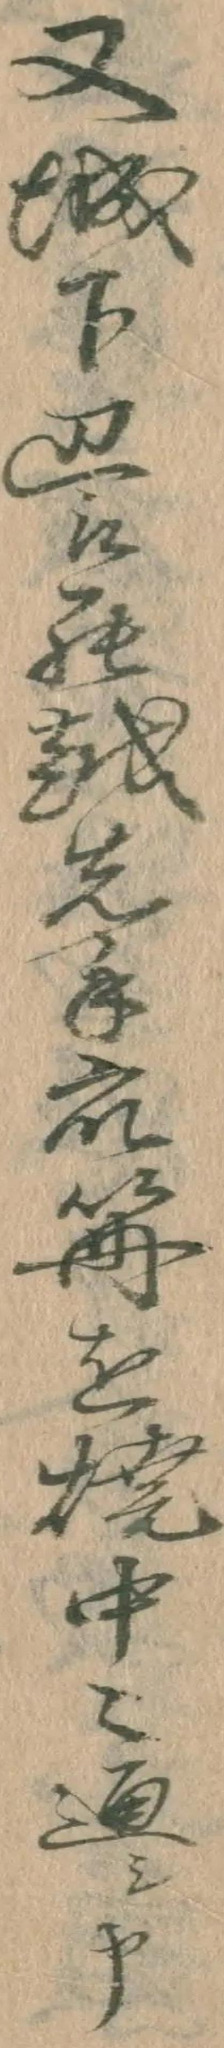又城下辺江罷越先手衆笧を焼中に通し申
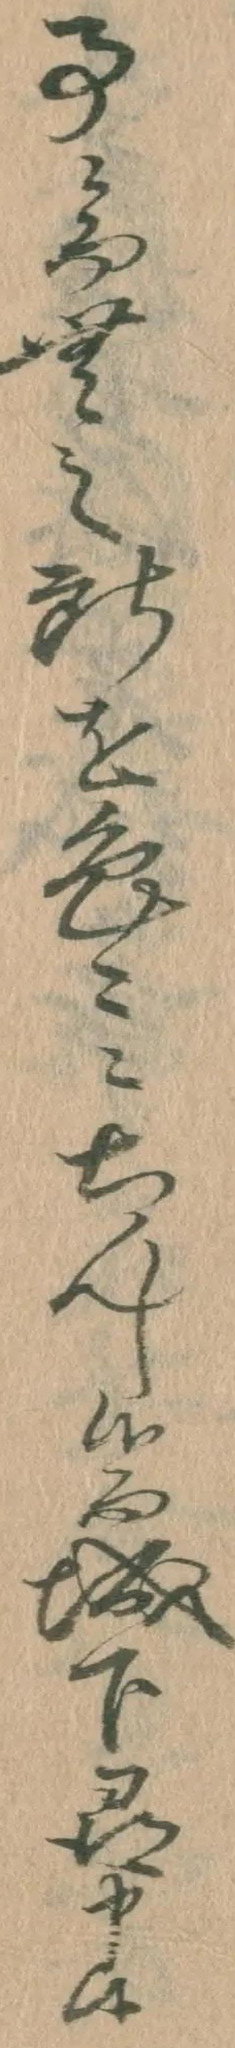事に而無之所を色々にちんし候而城下尋申候
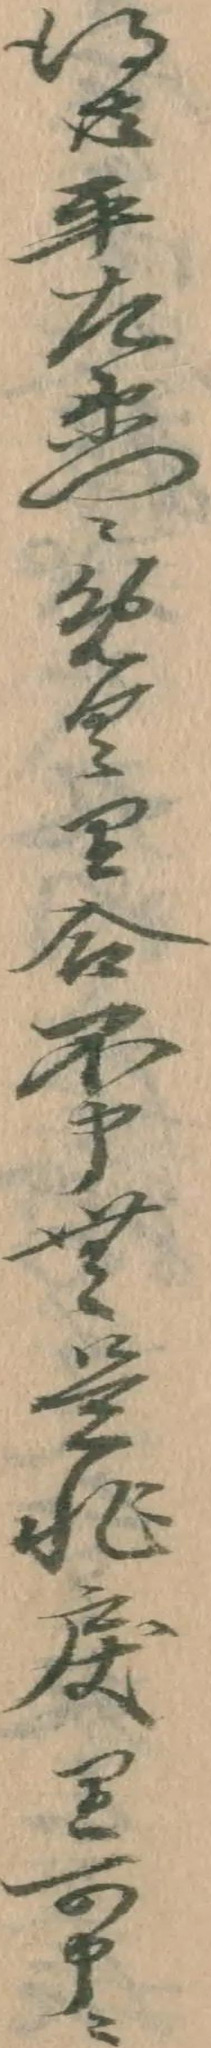得共平左衛門に免具合不申無是非戻里可申に
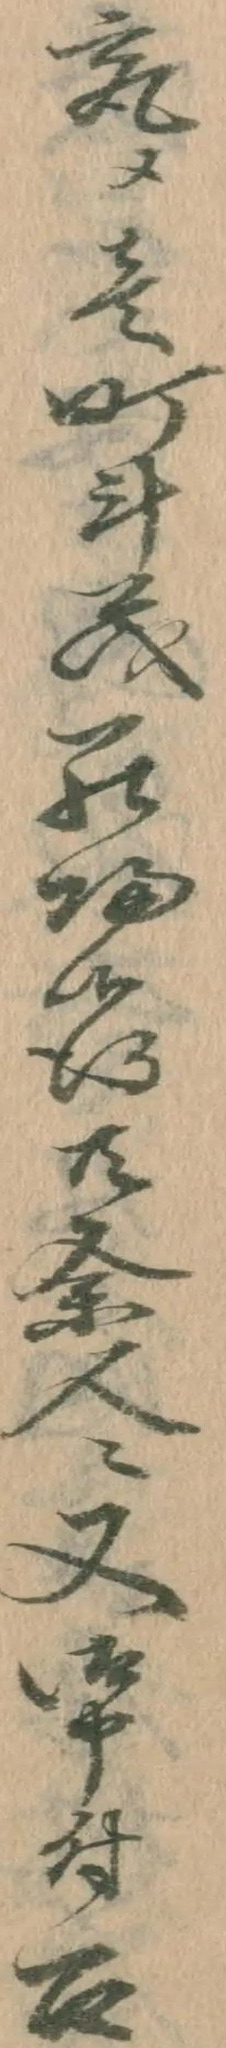究め壱町斗茂罷帰候得共余人に又御申付召
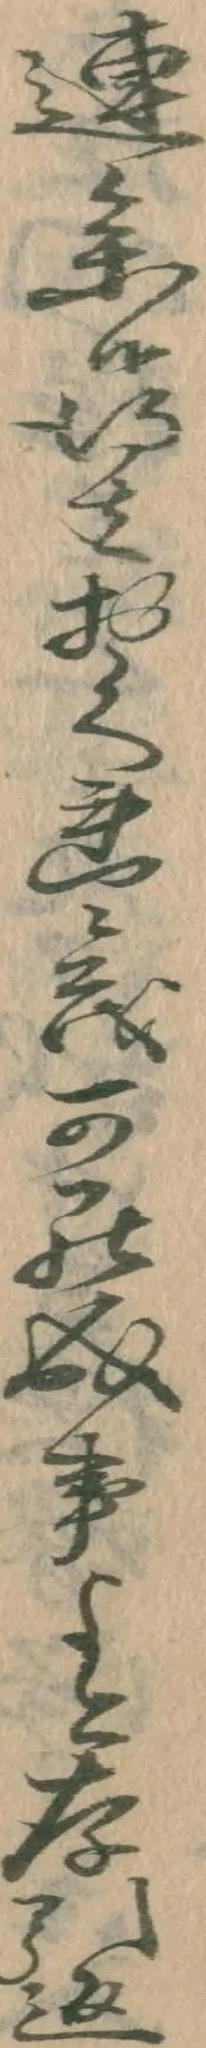連参候得者おく連に茂可罷成事よと存引返
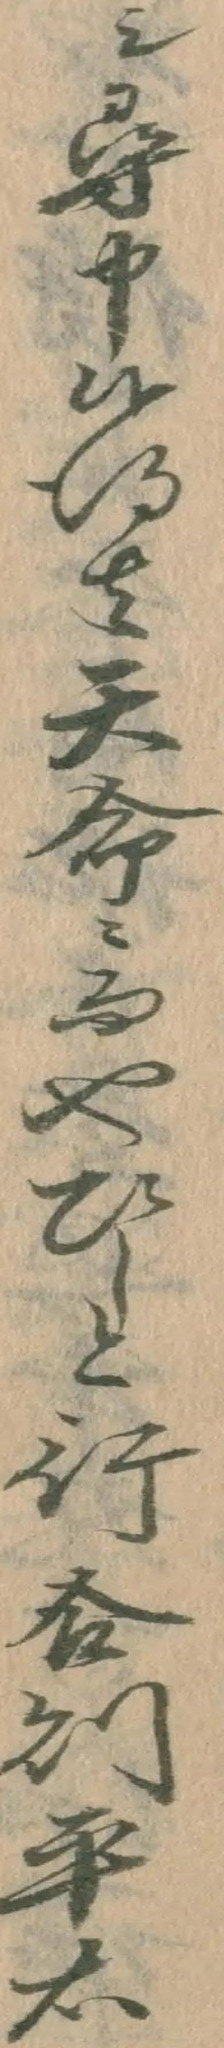し尋申候得者天命に而やひしと行合則平右
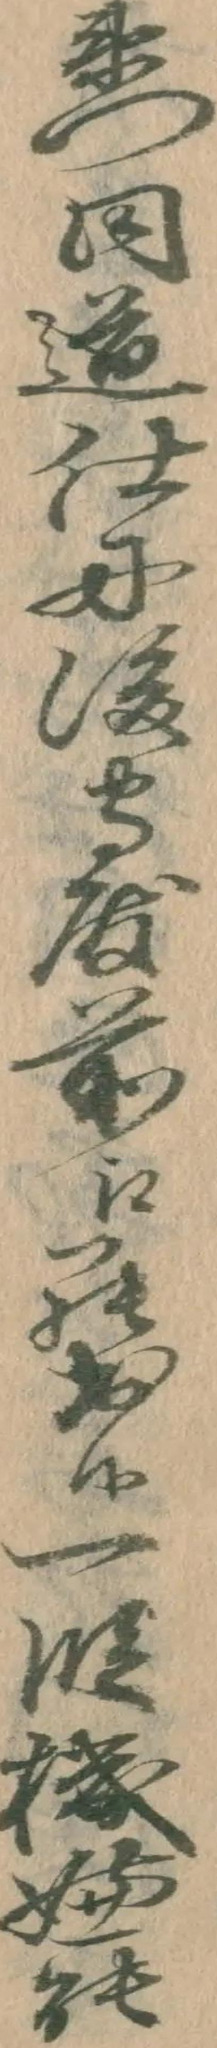衛門同道仕丹後守殿前江罷出候一段機嫌能
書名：切支丹御退治記 49巻. [8]
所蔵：国立国会図書館 National Diet Library, JAPAN
